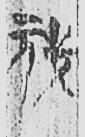戍
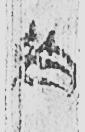於
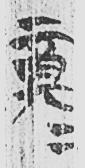奠=
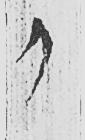人
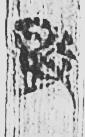{豆攴}
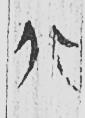北
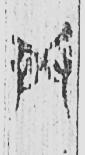門
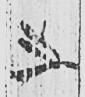之
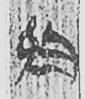於
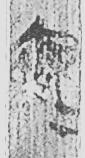秦=
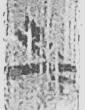之=
